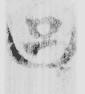昌
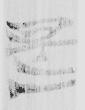是
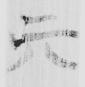亓
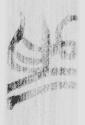爲
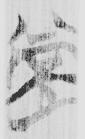當
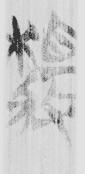{相力攴}
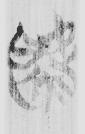{既火}
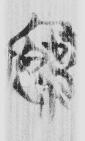{夂既火}
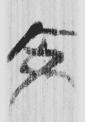交
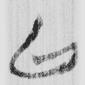㠯（以）
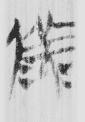備
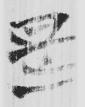是
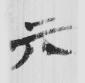亓
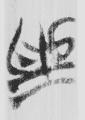爲
